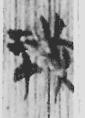戎
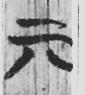亓
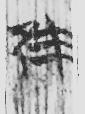隹
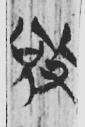敓（說）
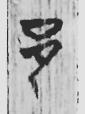邑
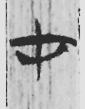才
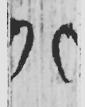北
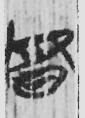{母日}（海）
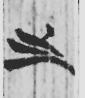之
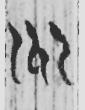州
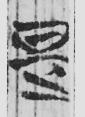是
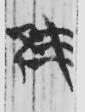隹
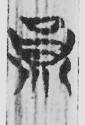員
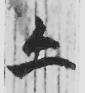土
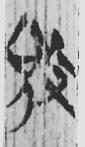敓（說）
